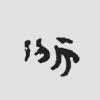所
